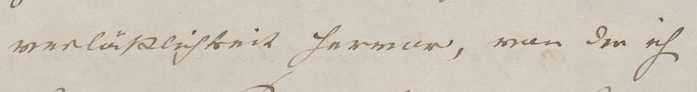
verläßlichkeit hervor, von der ich
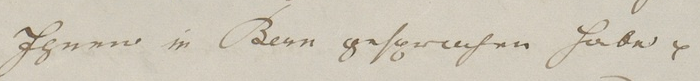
Ihnen in Bern gesprochen habe &
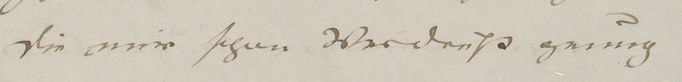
die mir schon Verdruß genug
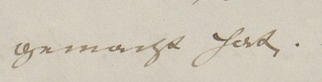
gemacht haben. –
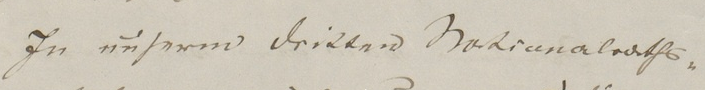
In unserem dritten Nationalraths-
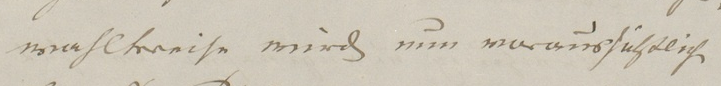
wahlkreise wird nun voraussichtlich
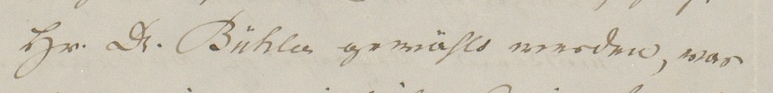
Hr. Dr. Bühler gewählt werden, was
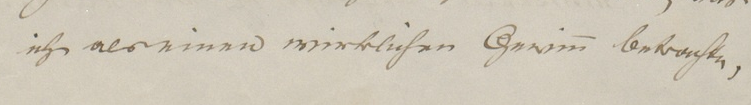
ich als einen wirklichen Gewinn betrachte,
